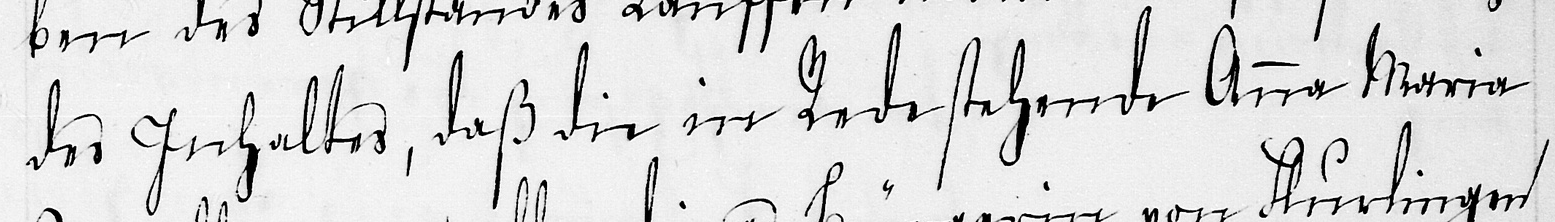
des Inhaltes, daß die in Rede stehende Anna Maria
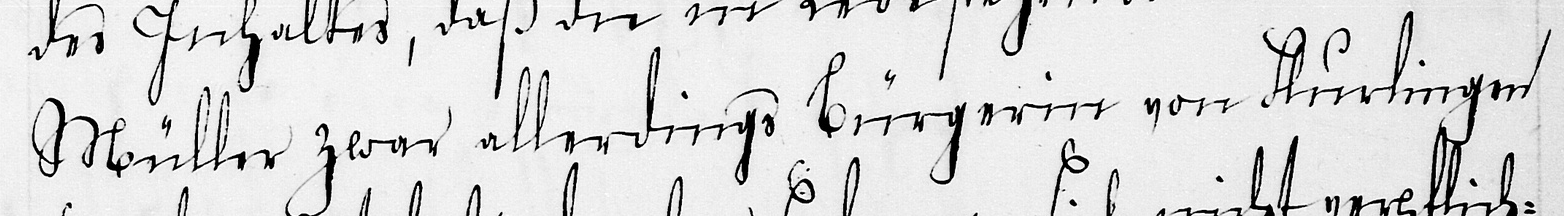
Müller zwar allerdings Bürgerin von Fluringen
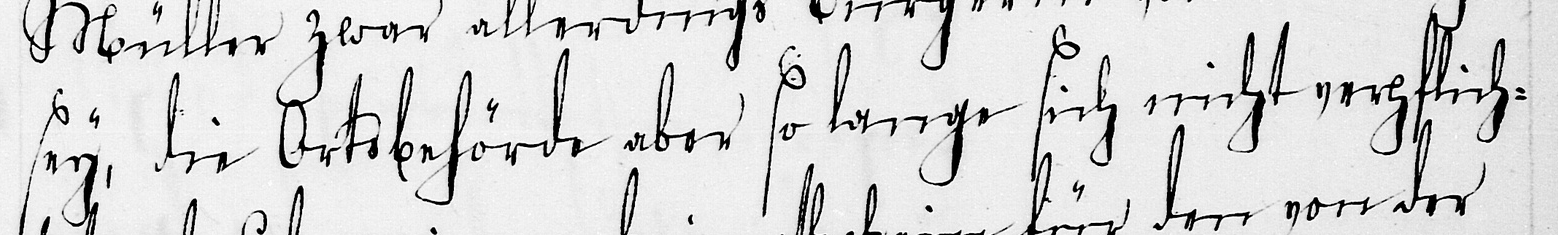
sey, die Ortsbehörde aber so lange sich nicht verpflic¬
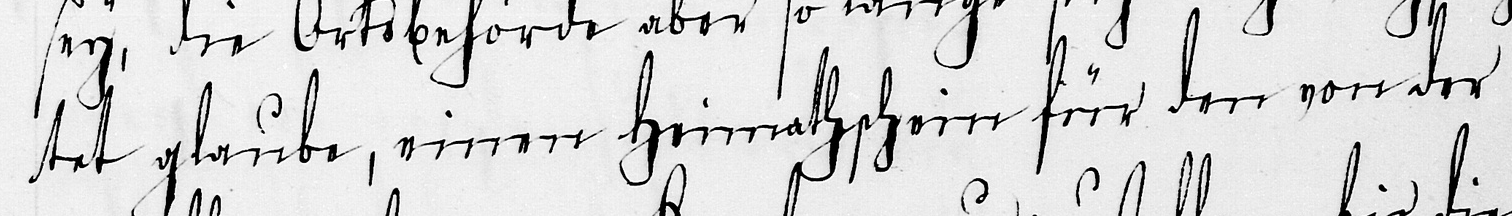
htet glaube, einen Heimathschein für den von der
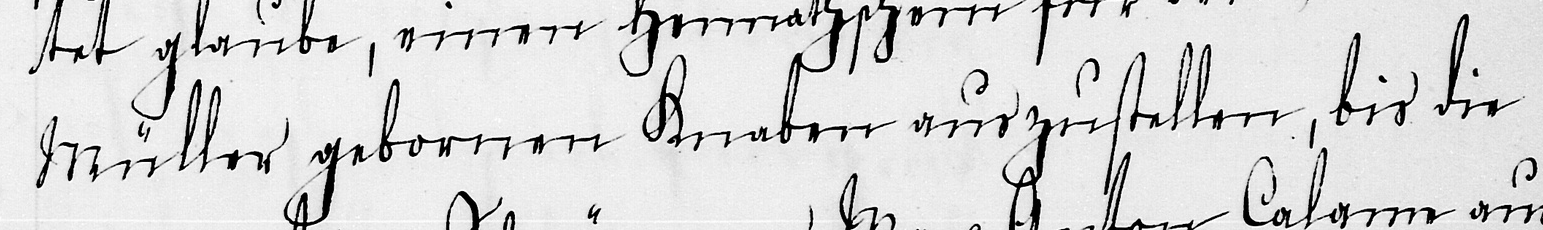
Müller gebornen Knaben auszustellen, bis die
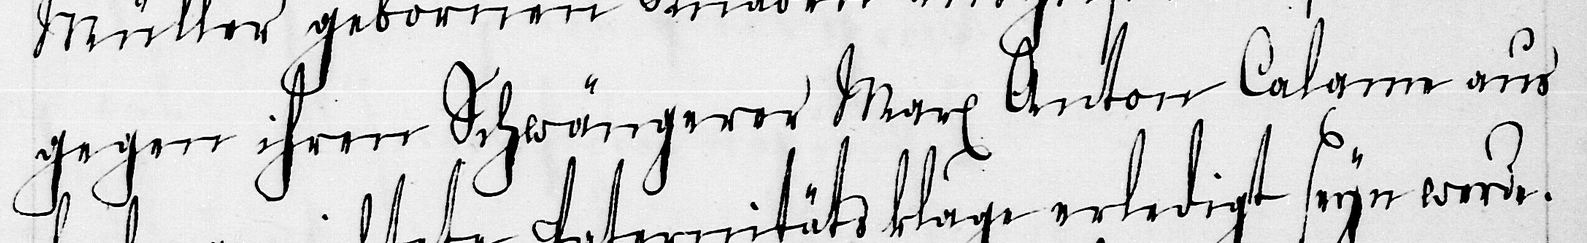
gegen ihren Schwängerer Marx Anton Calame aus
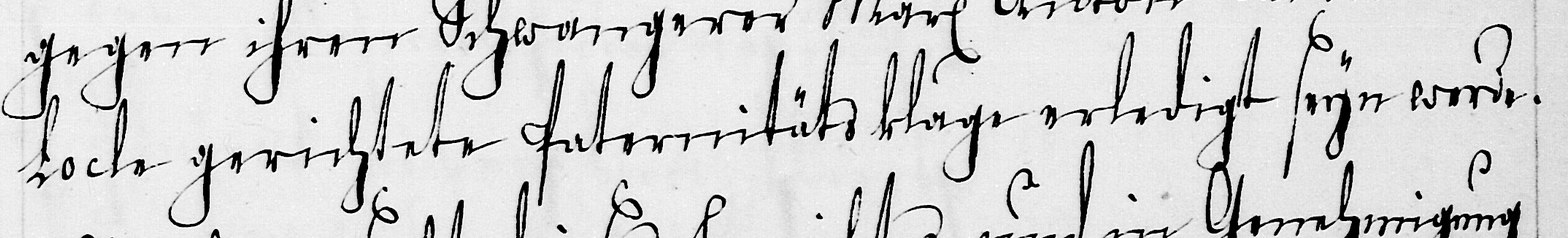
Locle gerichtete Paternitätsklage erledigt seyn werde.
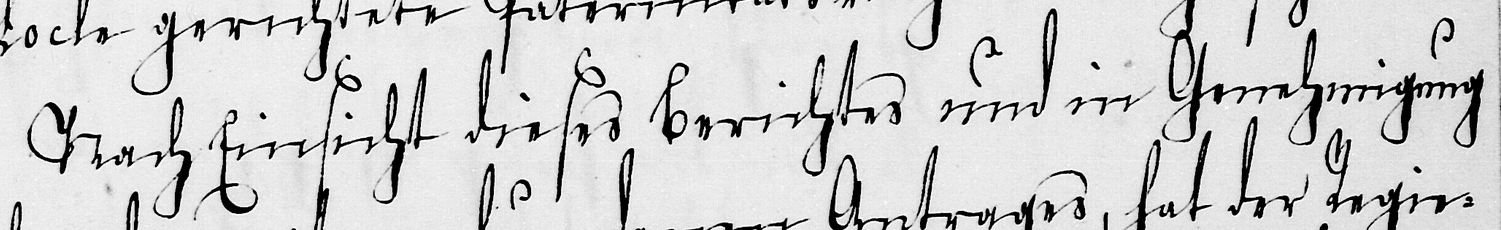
Nach Einsicht dieses Berichtes und in Genehmigung
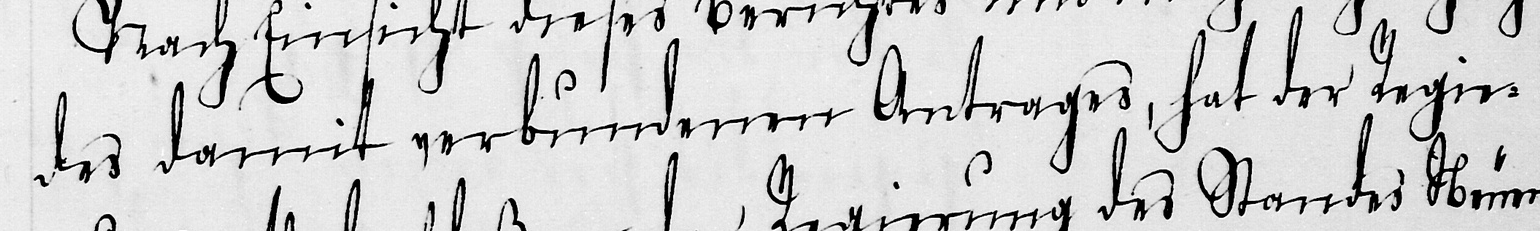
des damit verbundenen Antrages, hat der Regie¬
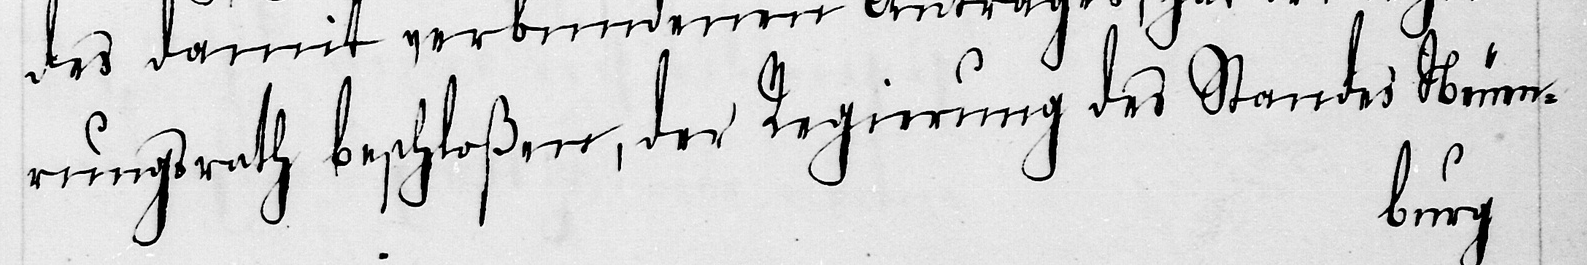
rungsrath beschloßen, der Regierung des Standes Neuen-
